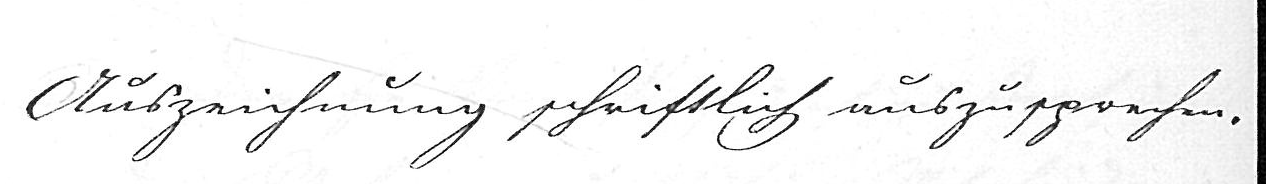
Auszeichnung schriftlich ausgesprochen.
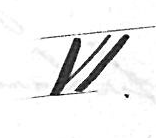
VI.
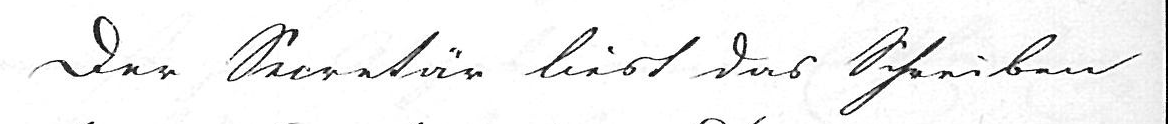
Der Secretär liest das Schreiben
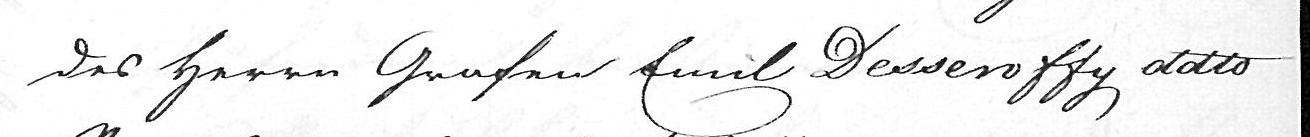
des Herrn Grafen Emil Desseweffy ddto.
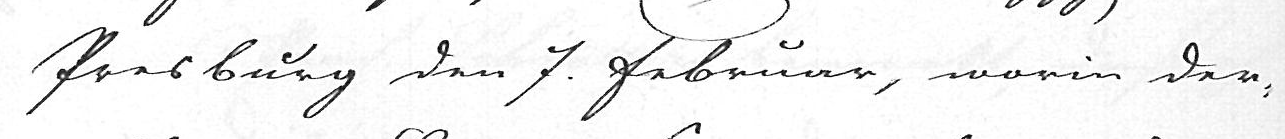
Presburg den 7 Februar, worin der-
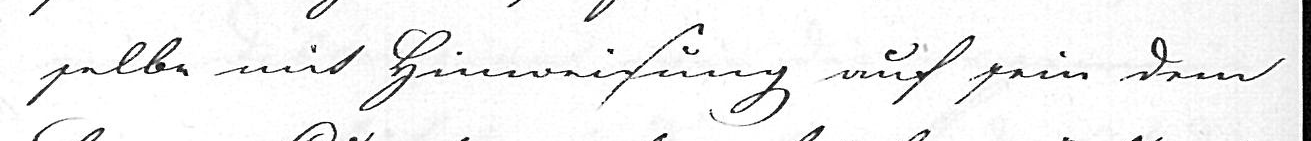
selbe mit Hinweisung auf sein dem
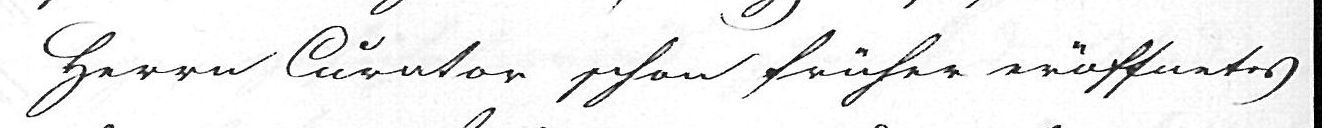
Herrn Curator schon früher eröffnetes
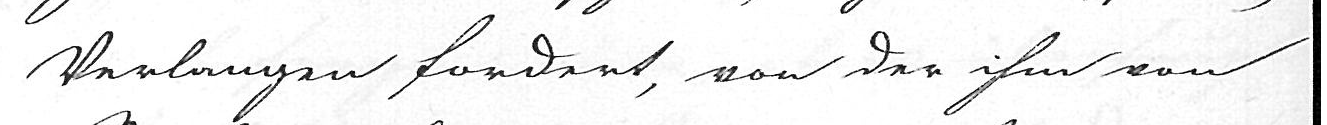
Verlangen fordert, von der ihm von
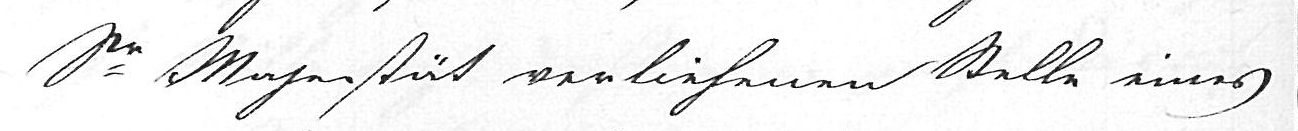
Sr Majestät verliehenen Stelle eines
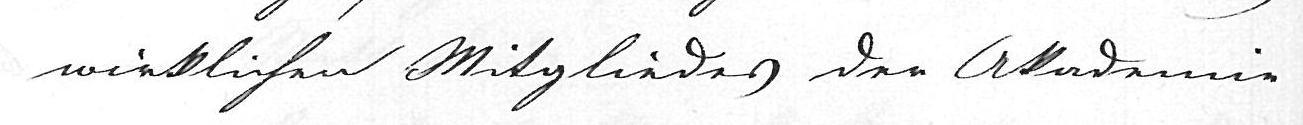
wirklichen Mitgliedes der Akademie
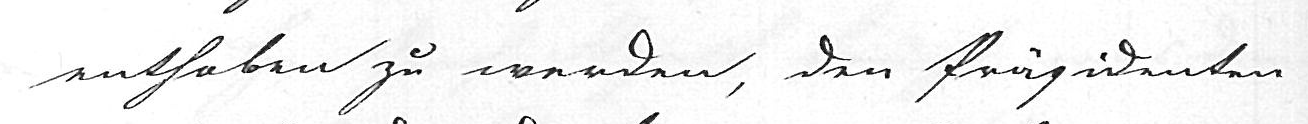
enthoben zu werden, den Präsidenten
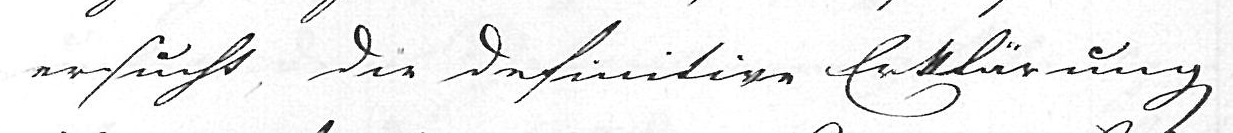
ersucht, die definitire Erklärung
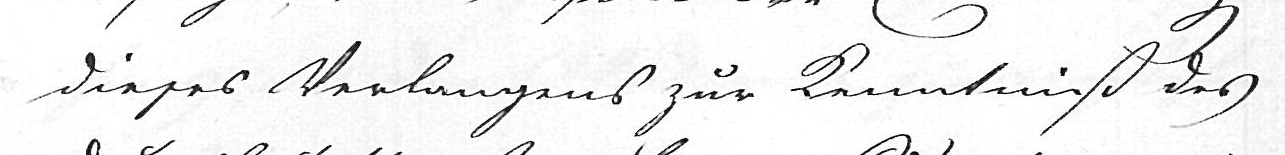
dieses Verlangens zur Kenntniß des
